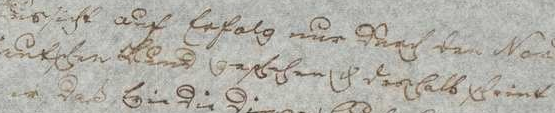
deutschen Bund geschehen & deshalb scheint
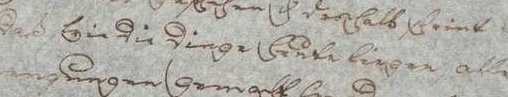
mir, daß, wie die Dinge heute liegen, alle
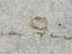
um die
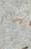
des
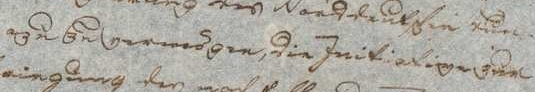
dazu zu vermögen, die Initiative zur
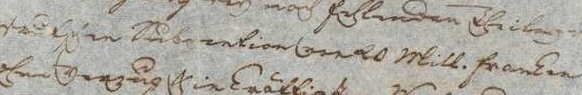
deutschen Subvention von 20 Mill. Franken
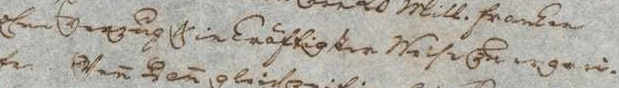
ohne Verzug & in kräftigster Weise zu ergrei-
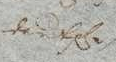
deutsche
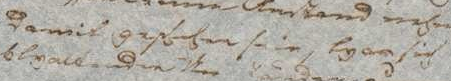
damit geschehen sein, was sich
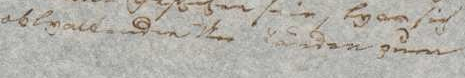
obwaltenden Umständen zum
